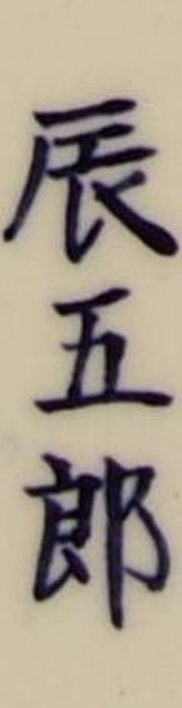辰五郎
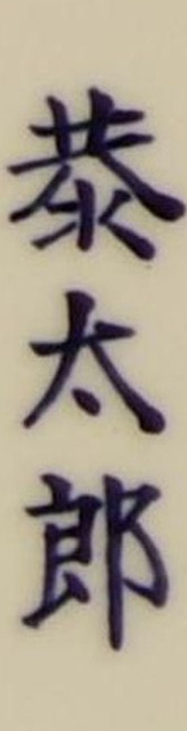恭太郎

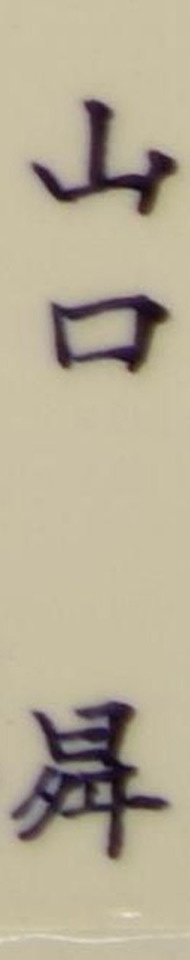山口昇
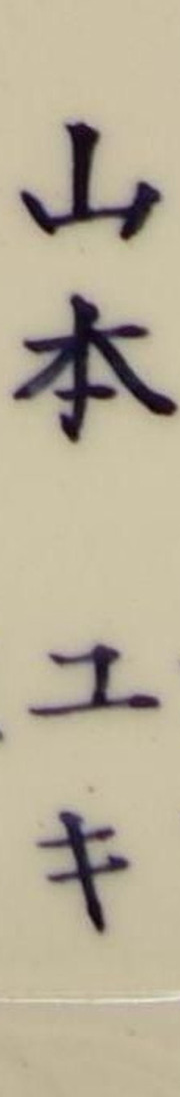山本ユキ
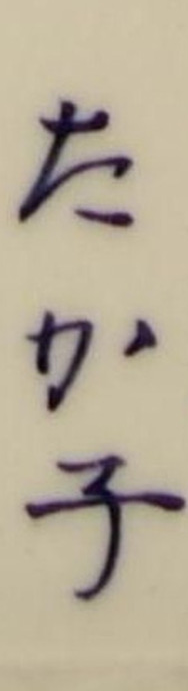たか子
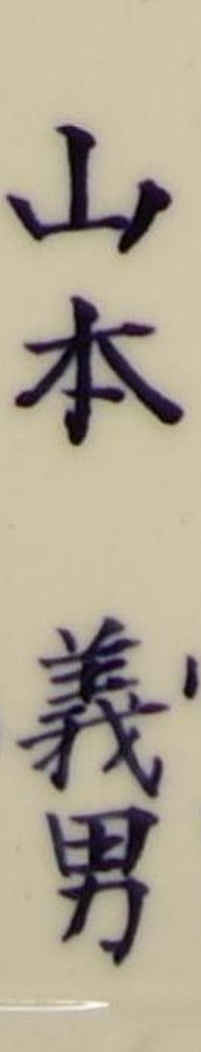山本義男
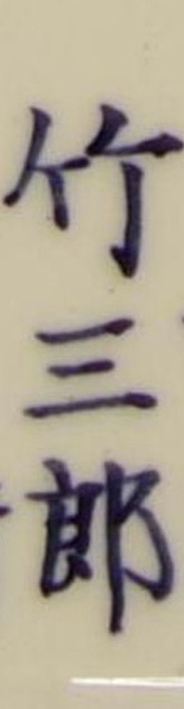竹三郎
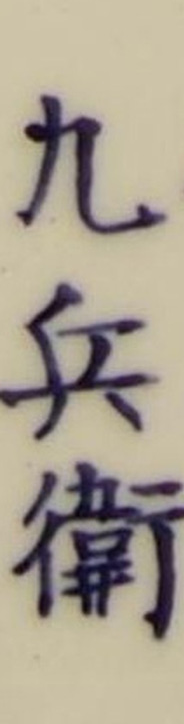九兵衛
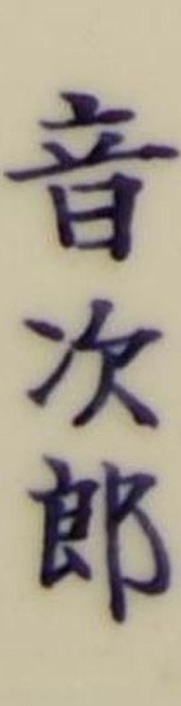音次郎
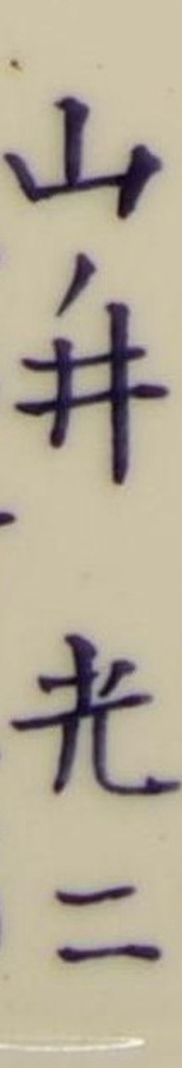山ノ井光二
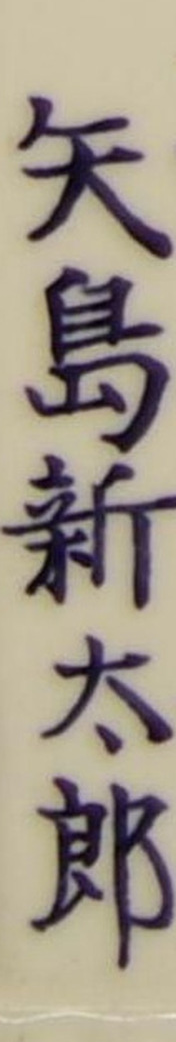矢島新太郎

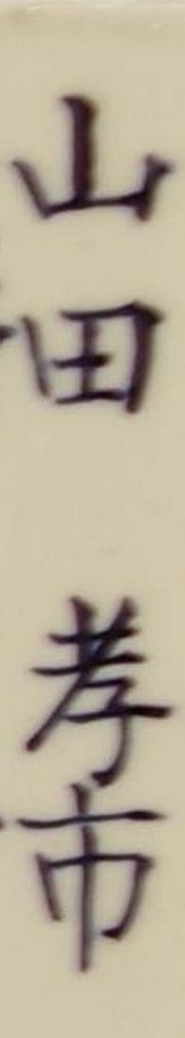山田孝市
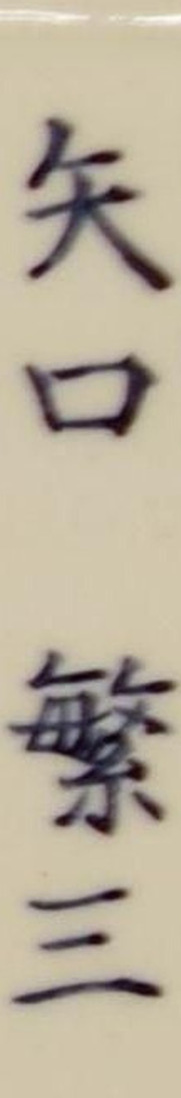矢口繁三
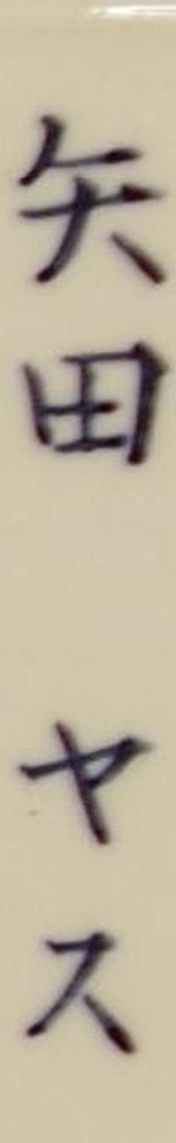矢田ヤス
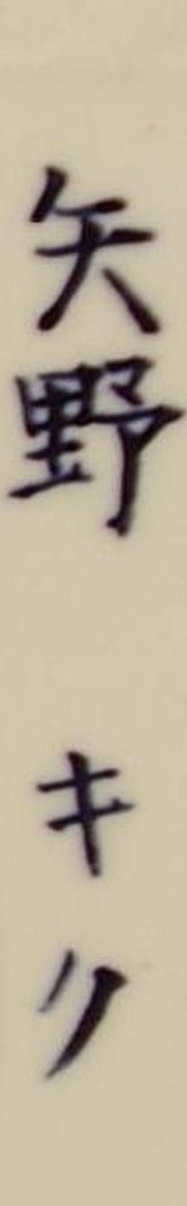矢野キク
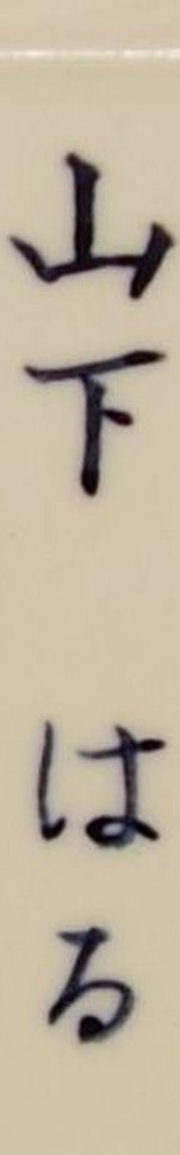山下はる
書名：E~L
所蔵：高野山金剛峯寺
